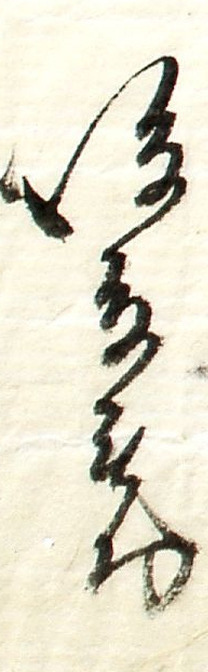後藤庄助
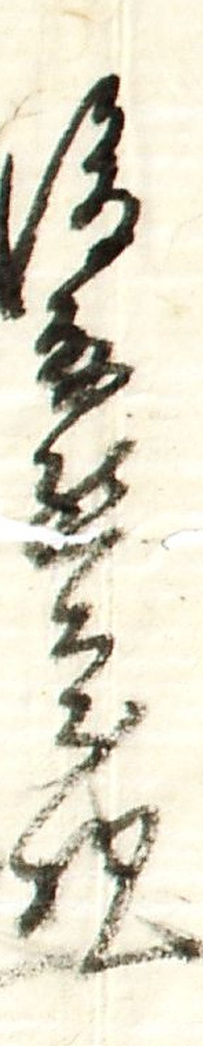後藤惣太郎様

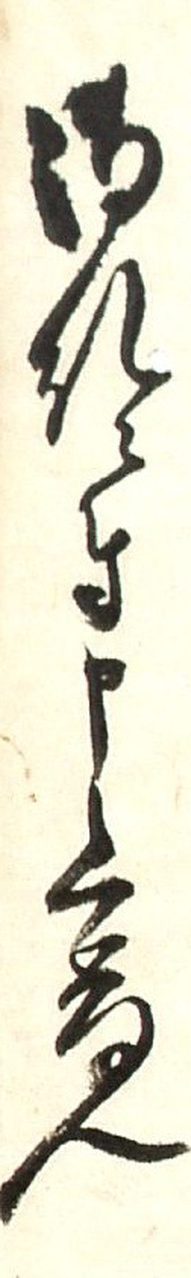御糺ニ付申上覚
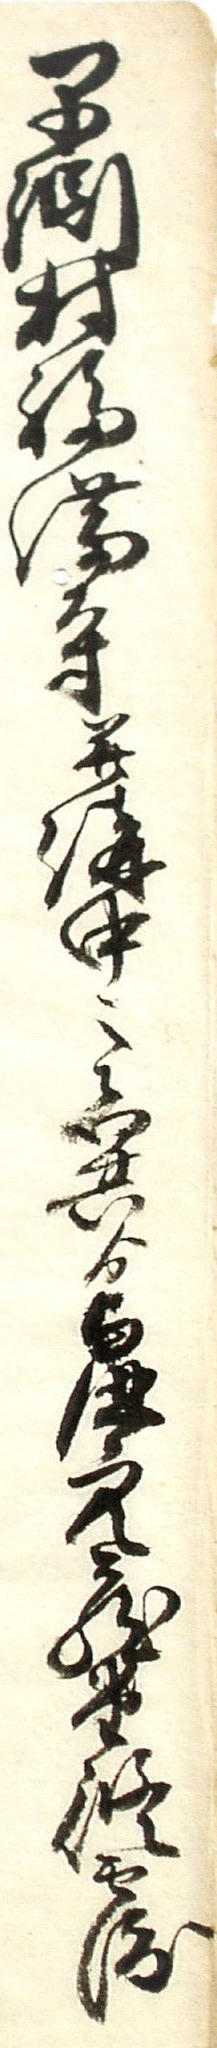早渕村福満寺幷講中之者共ゟ虚空蔵堂修覆
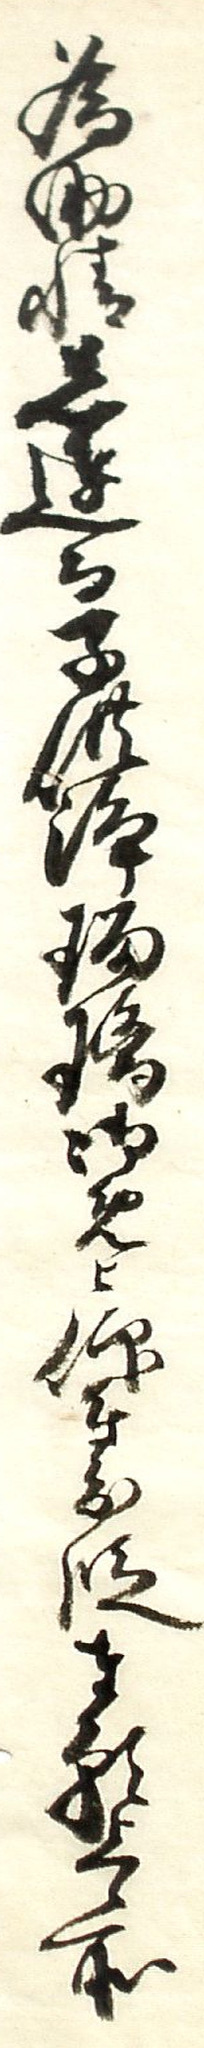為助情先達而子供浄瑠璃御免被仰付度段奉願上候所
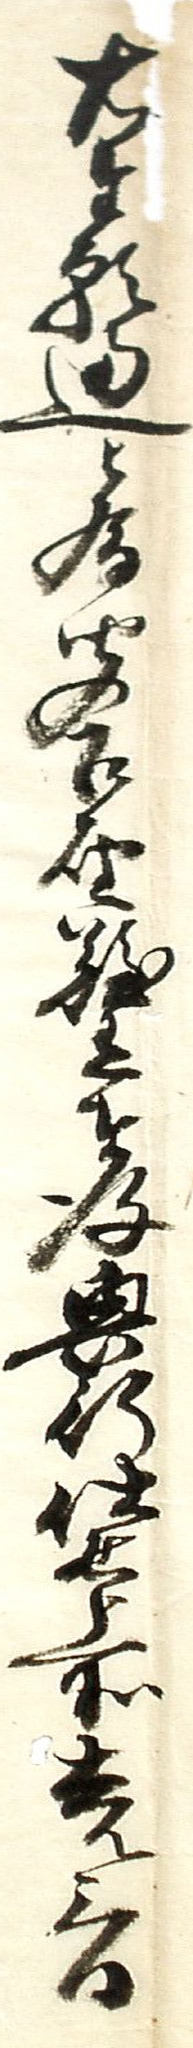右奉願通被為聞召届難有奉存興行仕居申所去ル三日
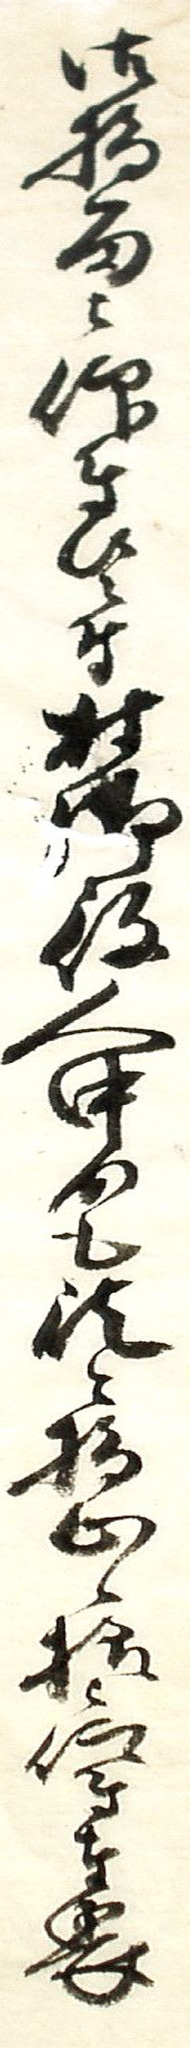御指留被仰付候二付村御役人中ゟも屹と指止候様被仰付奉畏
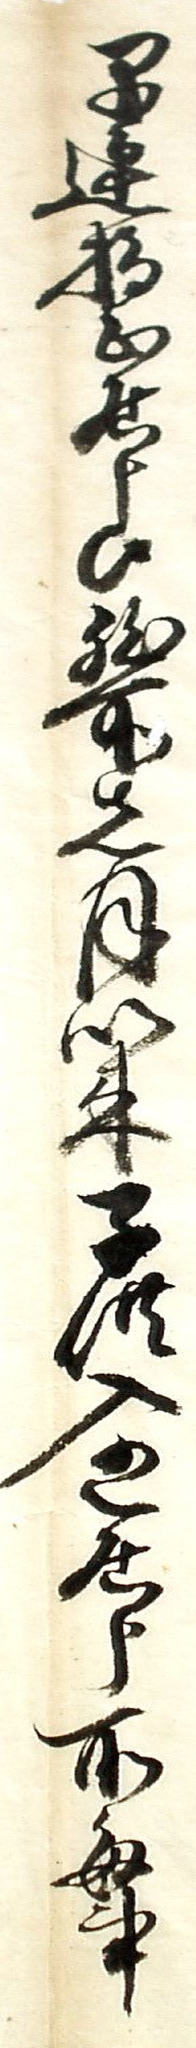早速指止居申候然所先月以来子供入込居申所毎事
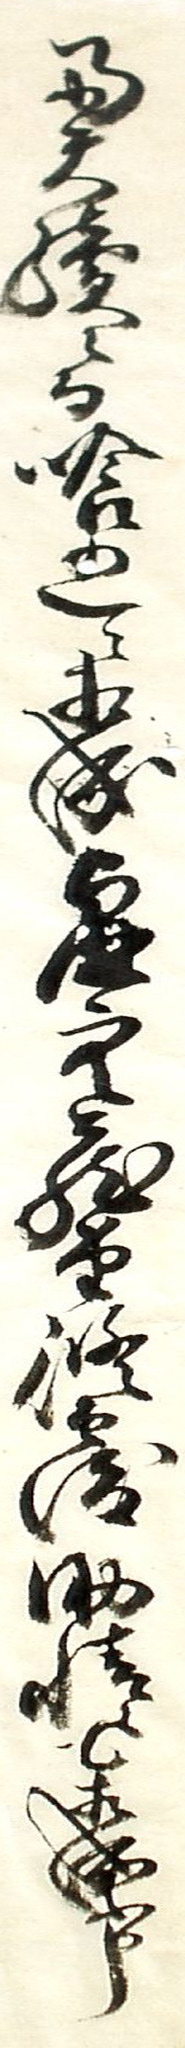雨天續ニ而喰込ニ相成虚空蔵堂修覆助情ニも相成不申
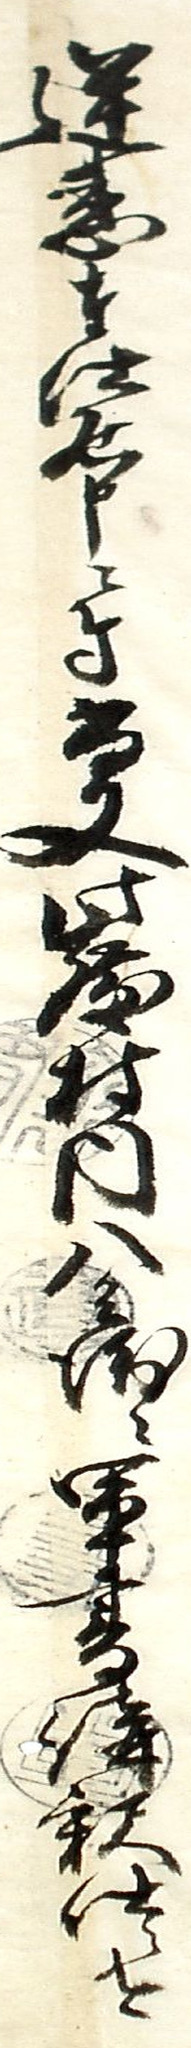迷惑奉仕居申ニ付尚又此度村内八兵衛ニ軍書講釈仕らせ
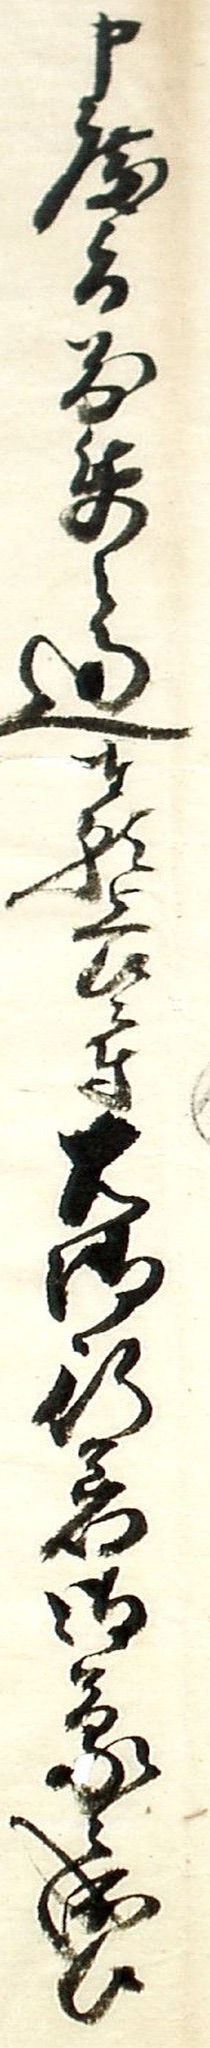申度旨別帋之通奉願上候ニ付右御行着御義ニ成候
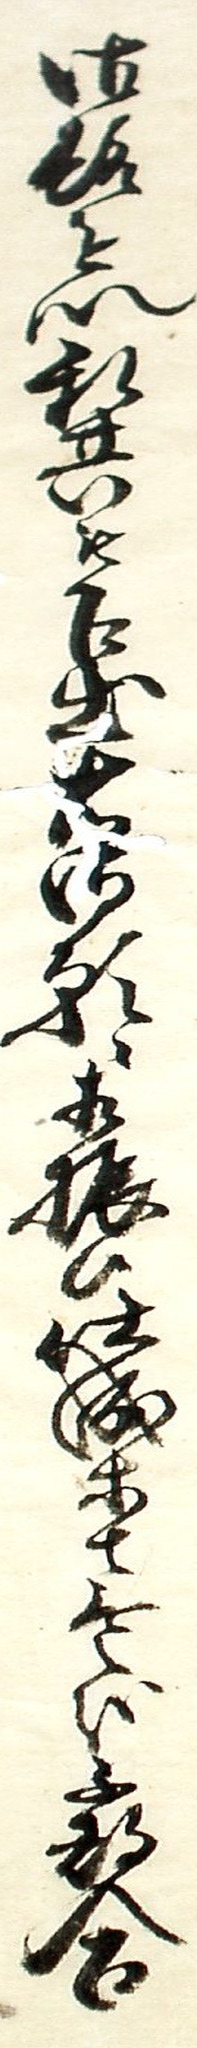御趣を以私共被召出右御願ニ相振候仕成等者無之哉不都合
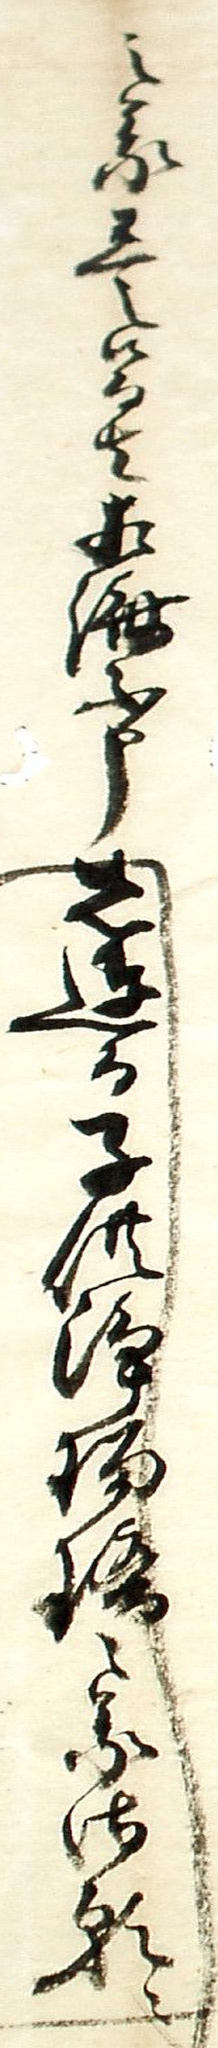之義有之候而者相濟不申先達而子供浄瑠璃之義御願ニ
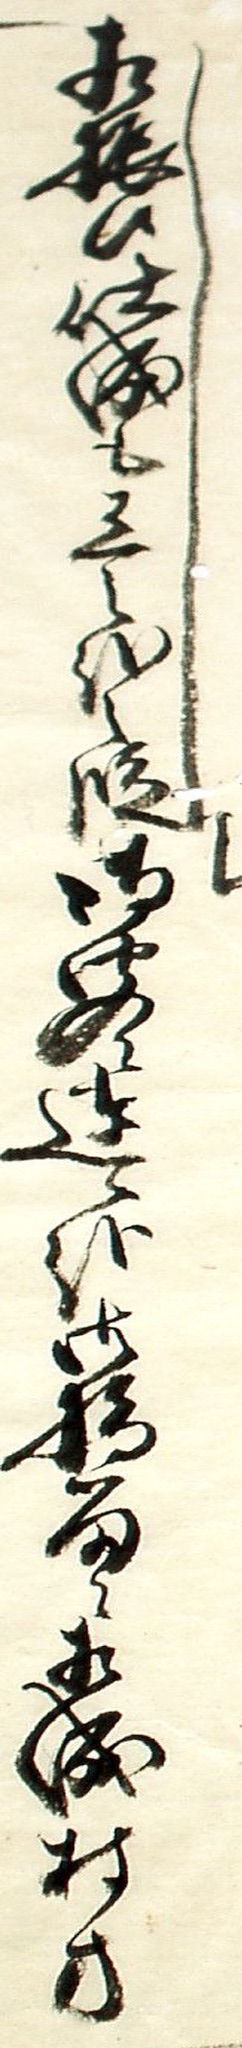相振候仕成も有之哉之段御聞ニ達候哉御指留ニ相成村方
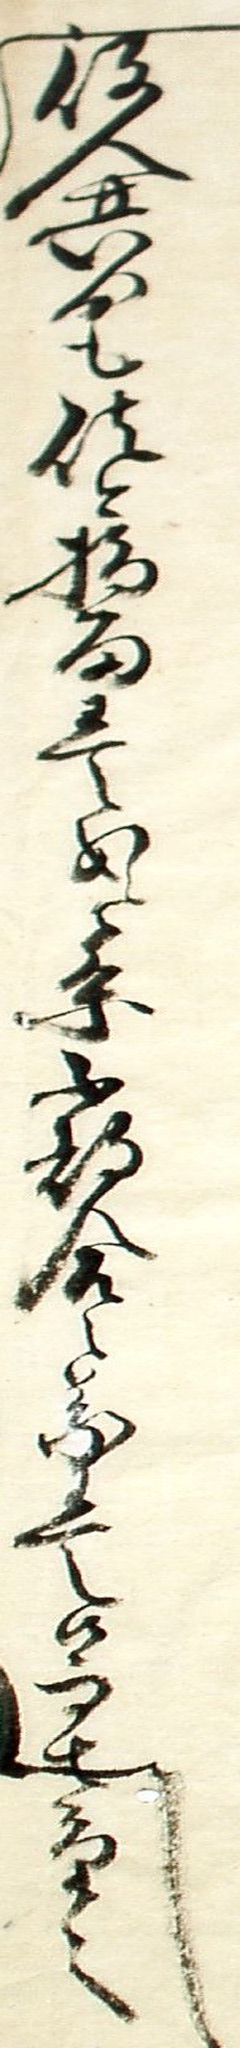役人共ゟも屹と指留有之義ニ候条不都合之義有之候而者重々
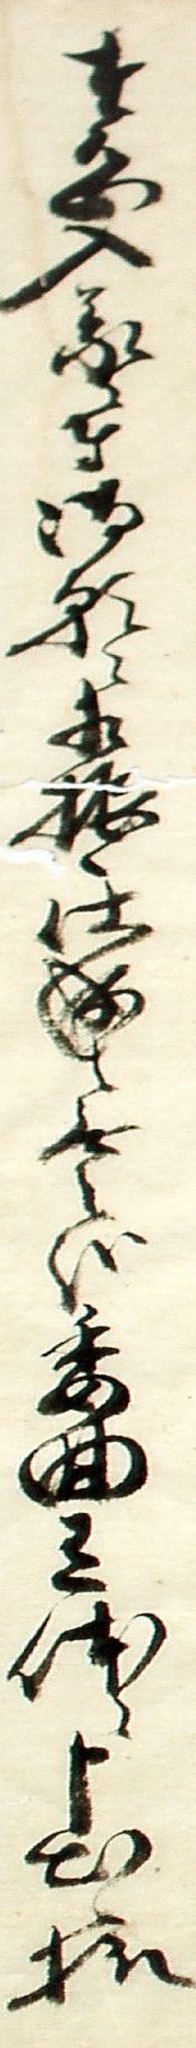奉恐入義ニ付御願ニ相振候仕成者無之哉委曲有体ニ申出候様
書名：(早渕村福満寺子供浄瑠璃願書）他
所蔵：鳴門教育大学 Naruto University of Education
